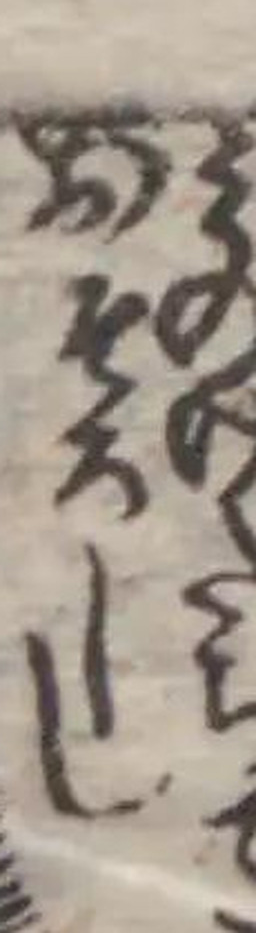おそろし
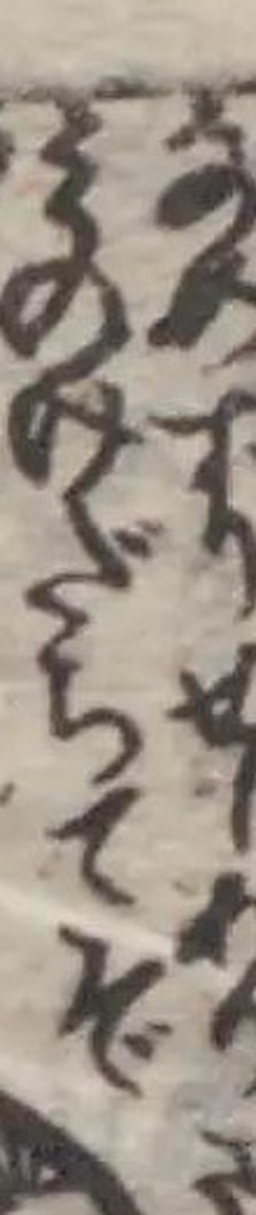みのけだちてぞ
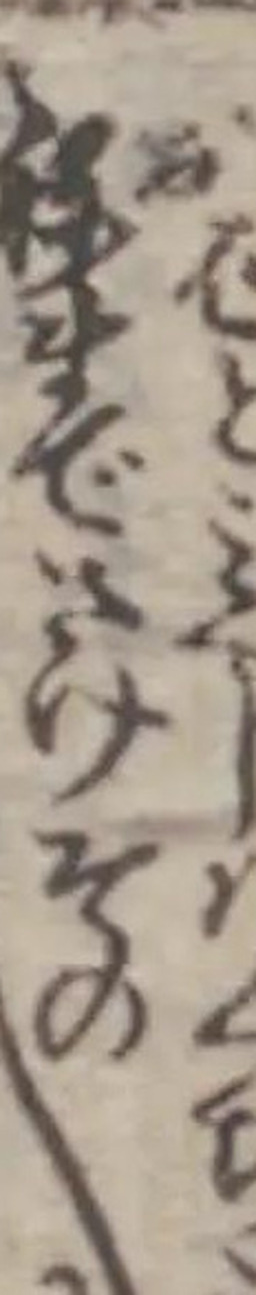ねまでさけその
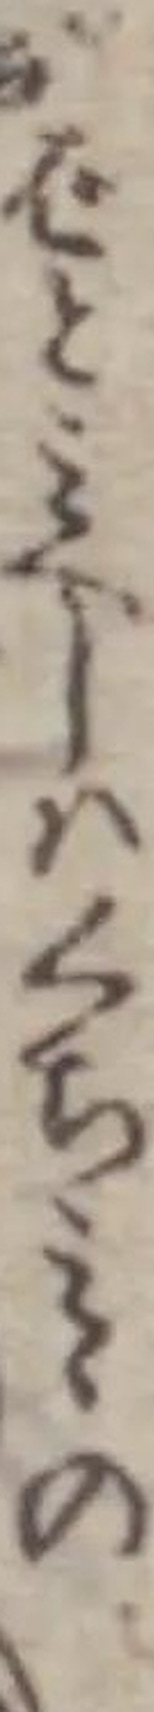おばとみへしはくちみゝの
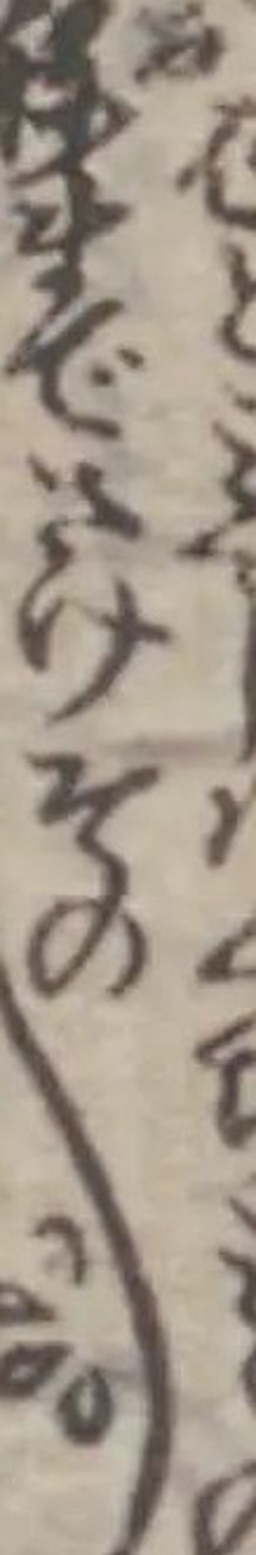ねまでさけその
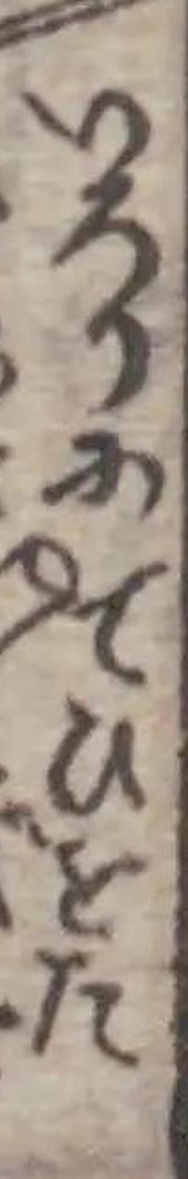いろりにてひをた
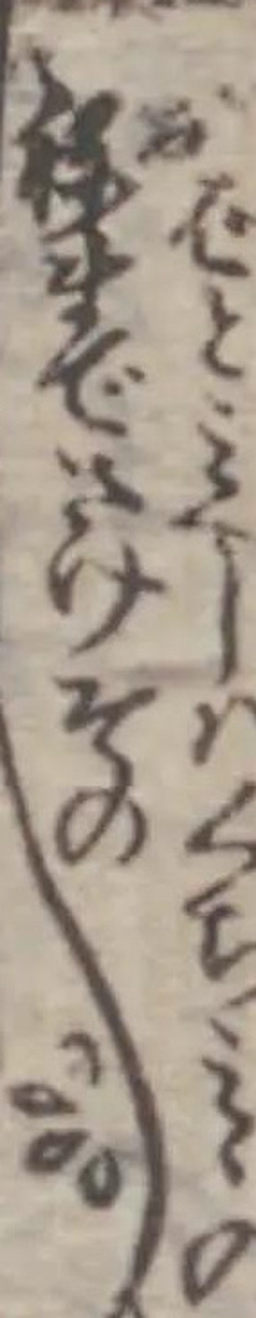ねまでさけその
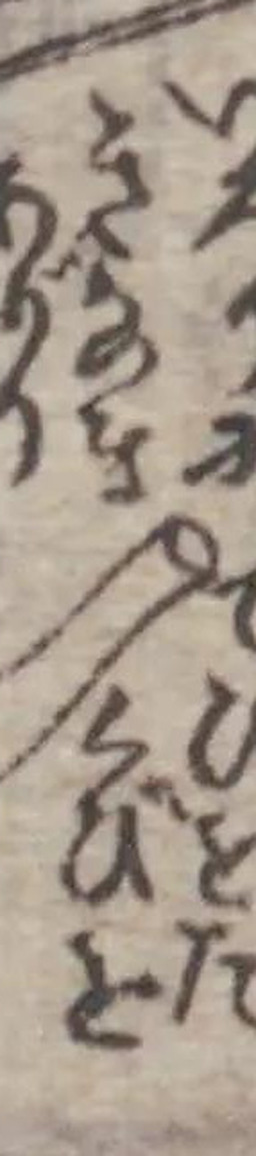きなまくひを
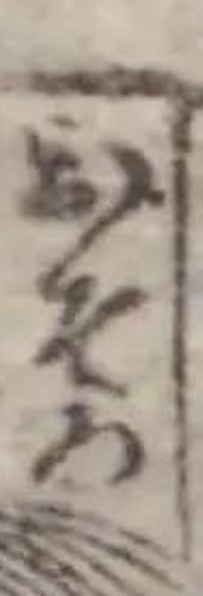おそろ
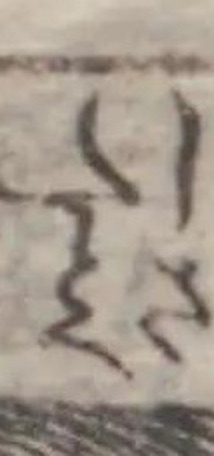たとへ
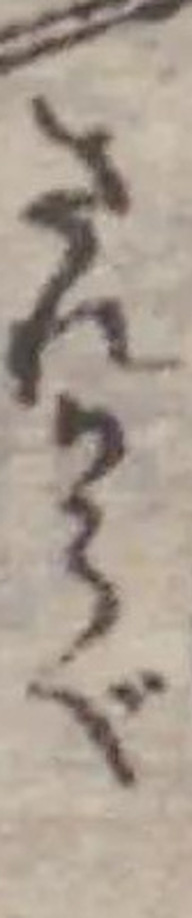されかうべ
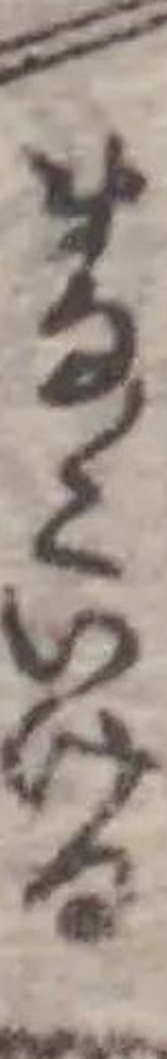まるといける
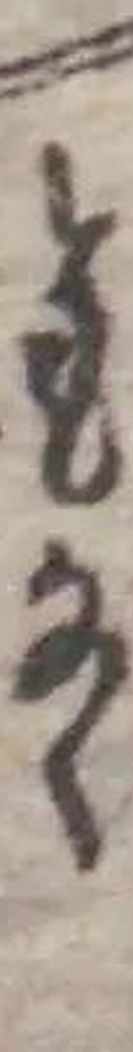ともなく
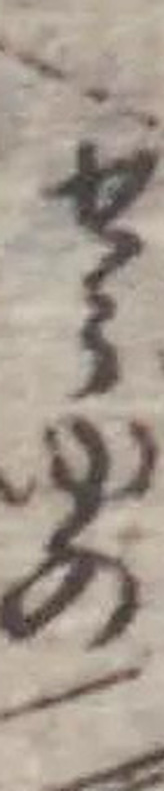せうゆの
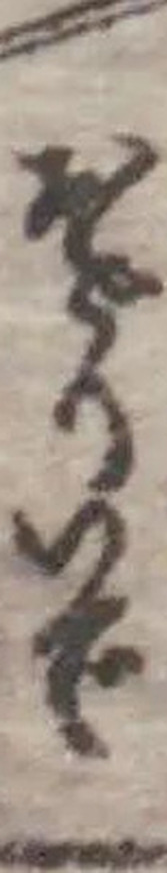おどりいで
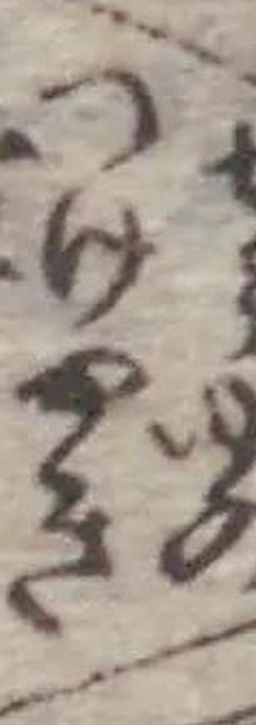つけやき
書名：鎌田又八 2巻
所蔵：国立国会図書館 National Diet Library, JAPAN
